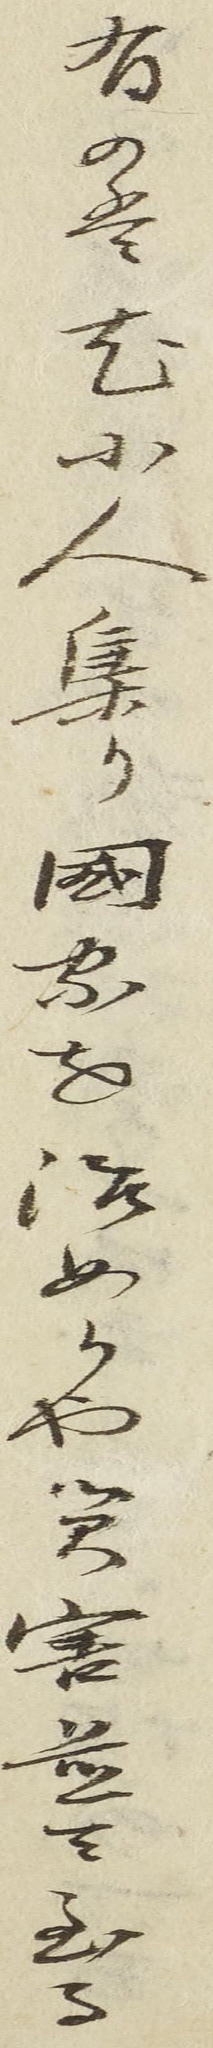有のは尤小人集り国家を治めりや災害並て至る
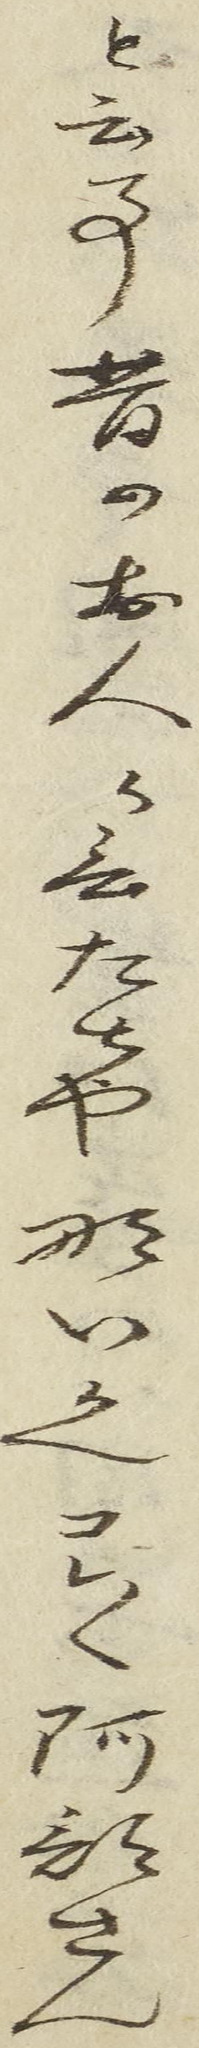と云事昔のお人か云たちやないかへコレ〳〵阿部さん

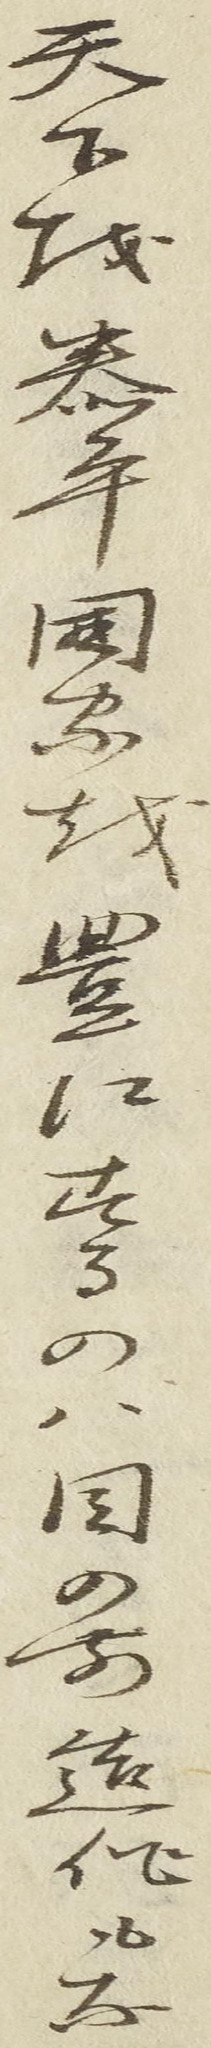天下を泰平国家を豊にするのハ目の前造作もな
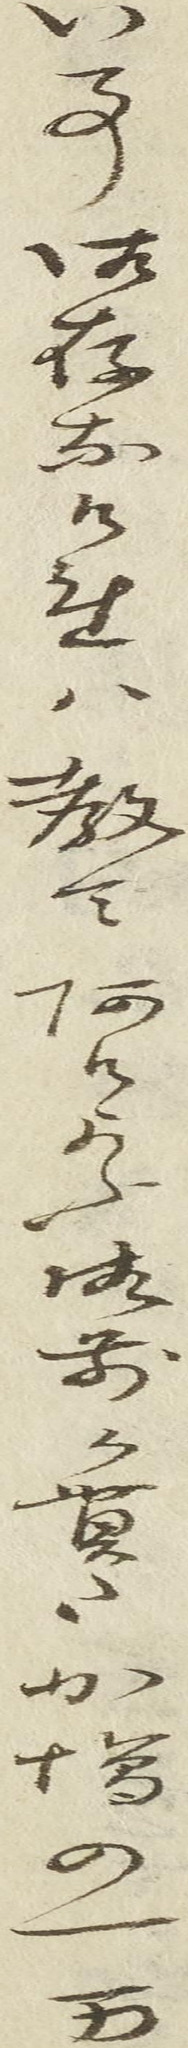い事御存なけれハ教てあけよふ御前か貰たか増の一万
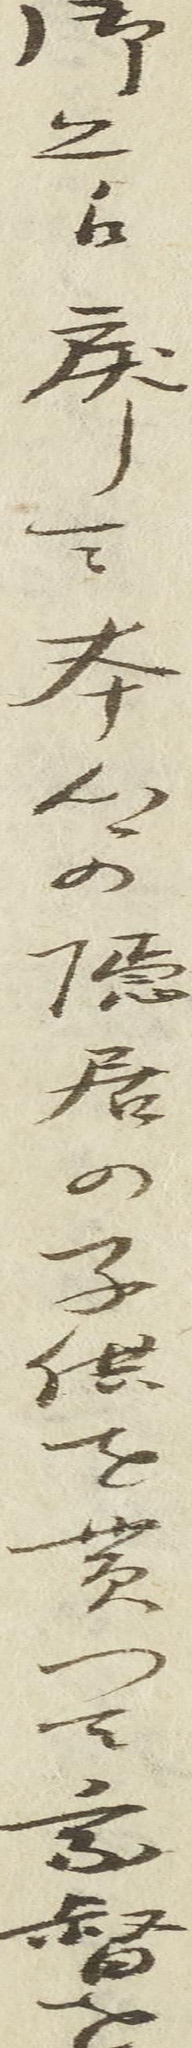御上江戻して本郷の隠居の子供を貰って家督を
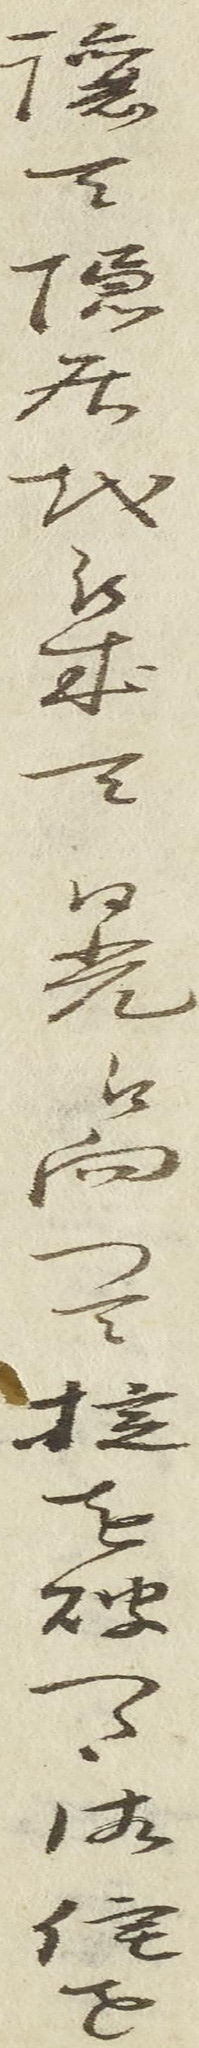譲て隠居を被成て日光江向つて掟を破つた御侘を
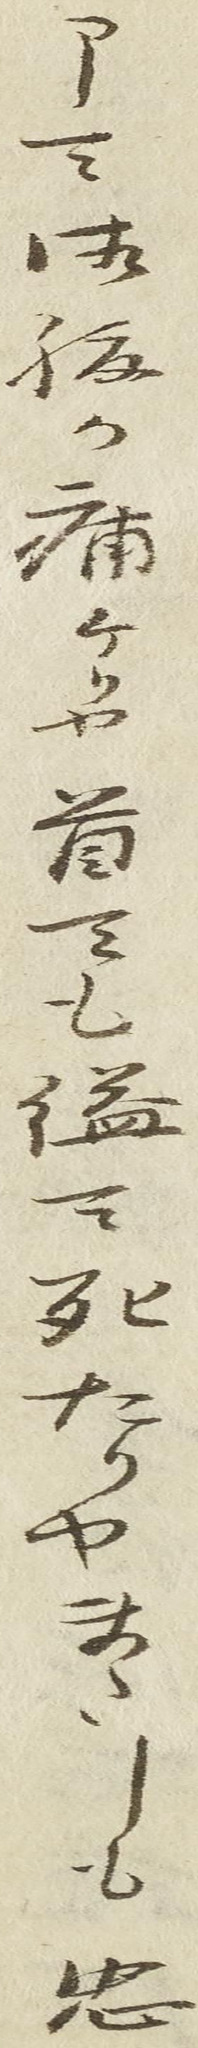申て御腹の痛ヶりや首ても溢て死たりやあまたしも忠
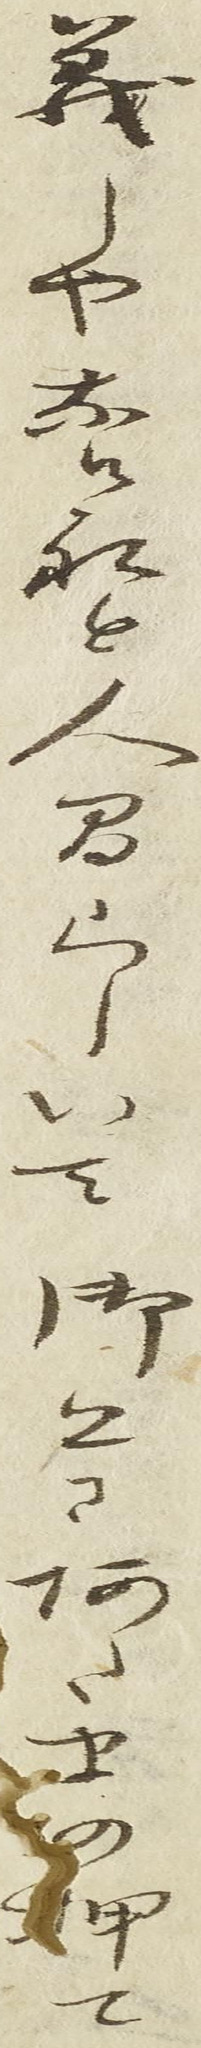義しやなけれと人間らしいて御上にあたまの押て
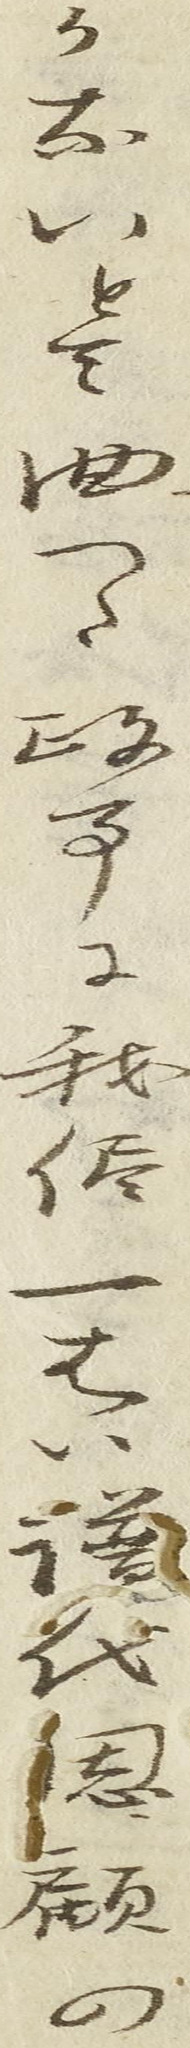かないとて曲つた政事に我儘一はい譜代恩顧の
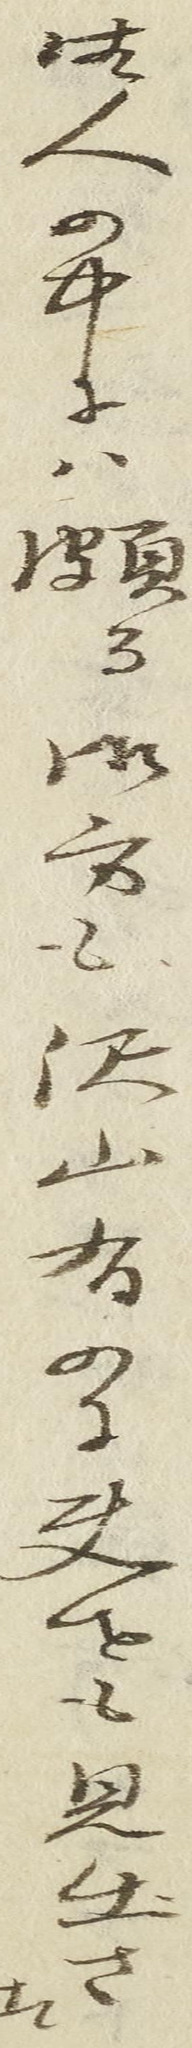御人の中にハ頗る御方も沢山有のに夫をも見出さす
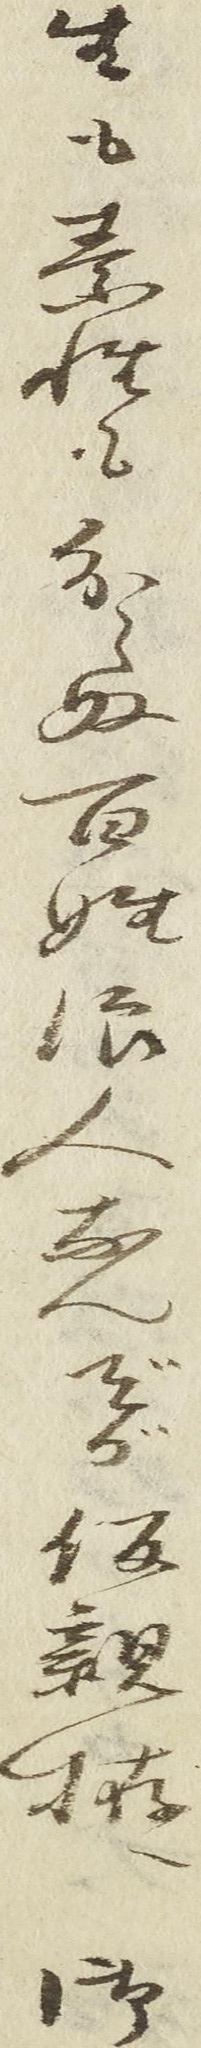生も素性も分らぬ百姓浪人なんぞが仮親拵へ御
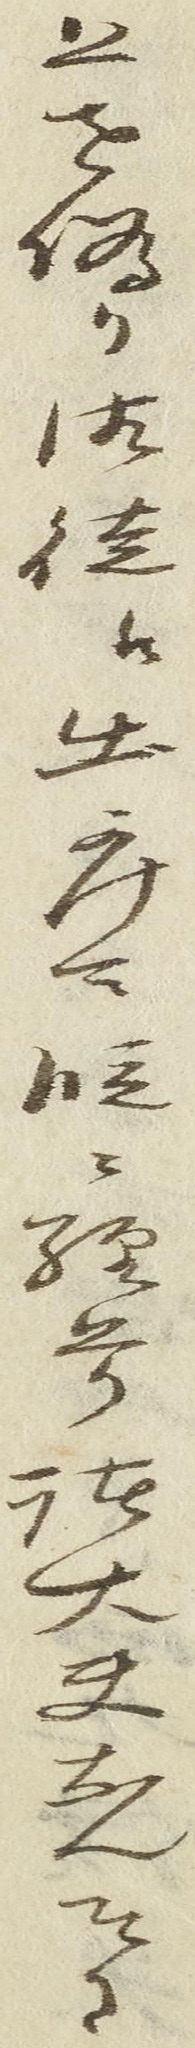上を偽り御徒江出かけて段々強上り諸大夫なんそ二
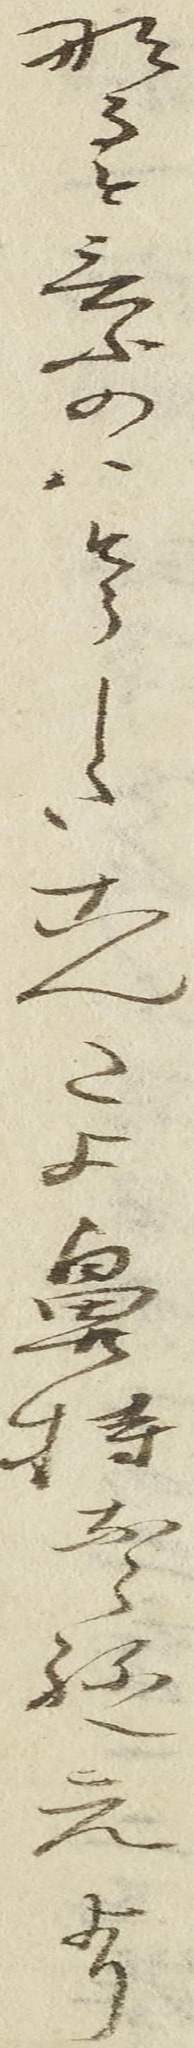なると云ふのハとうしたこんたよ鼻持ならねへ元より
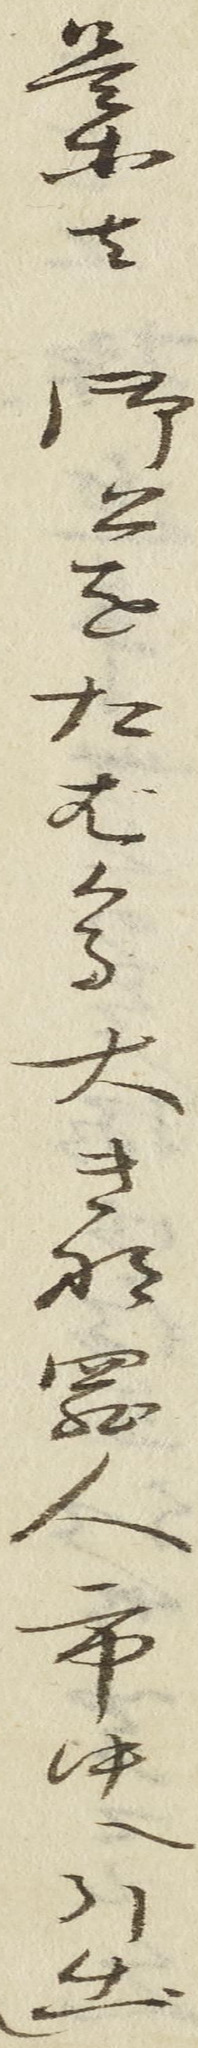是等は御上をたはかる大きな罪人市中へ引出し
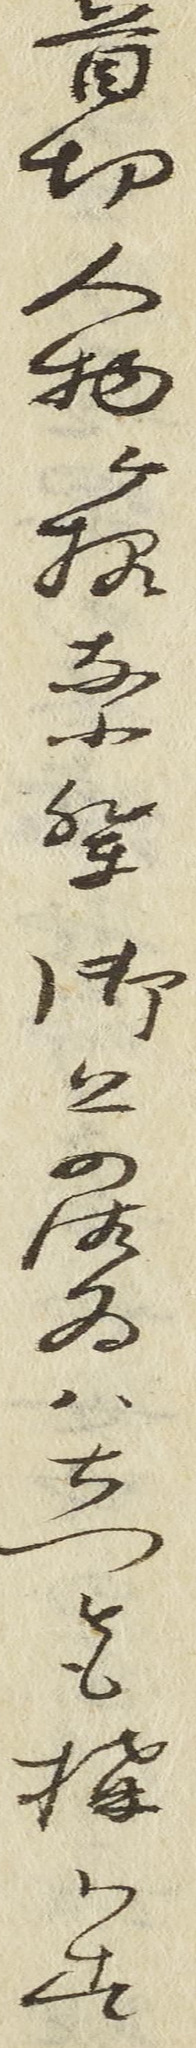首切人物ヶ様な小輩御上の御為ハちつとも構わす
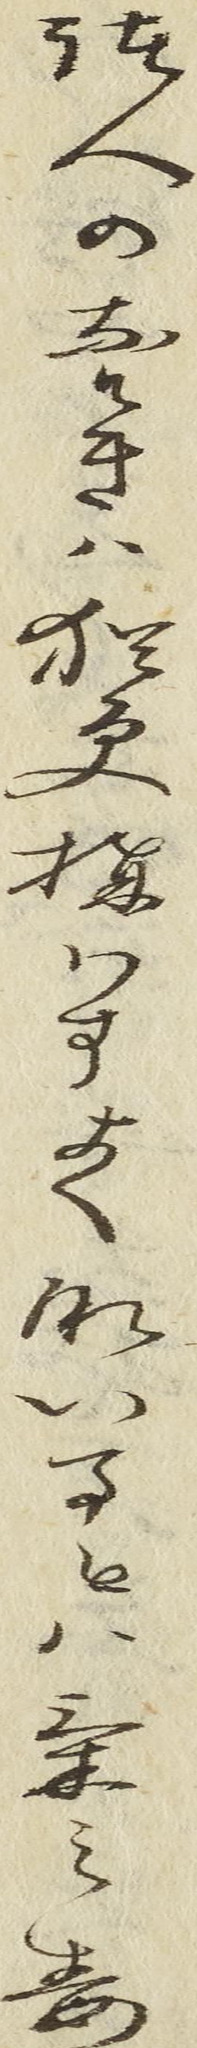諸人のなけきハ猶更構わすよくない事とハ気之毒
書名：世説ヤンレフシ写、駿州田中城地震ニ付内外破損御届書、豫州大洲城地震ニ付内外破損御届書・封廻状
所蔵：東京大学地震研究所図書室 Earthquake Research Institute Library, The University of Tokyo, JAPAN
